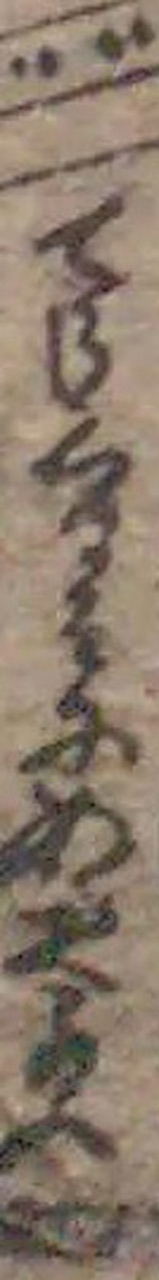てうしくるみにあたへよふ
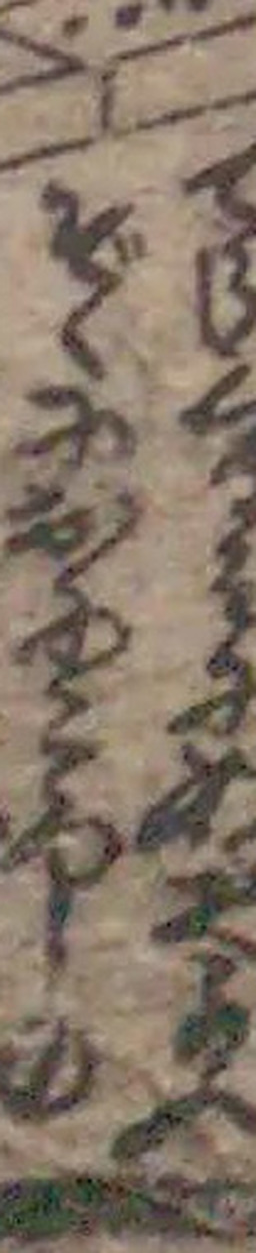ぞくにおにころしの
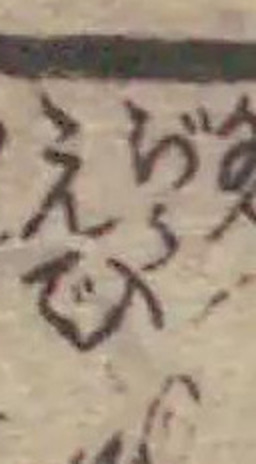こんで
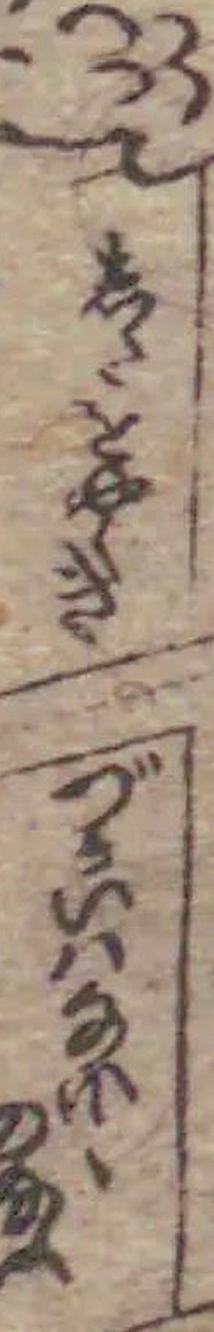したをやくきづかいはないと
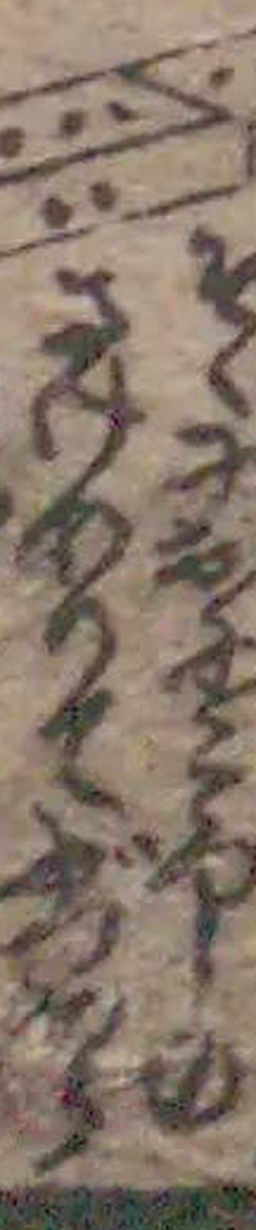さけありてぶつほう
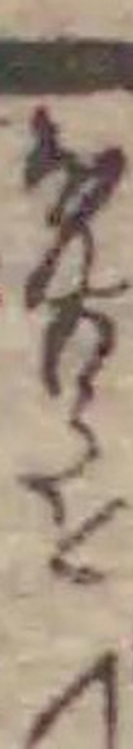ほんもうを
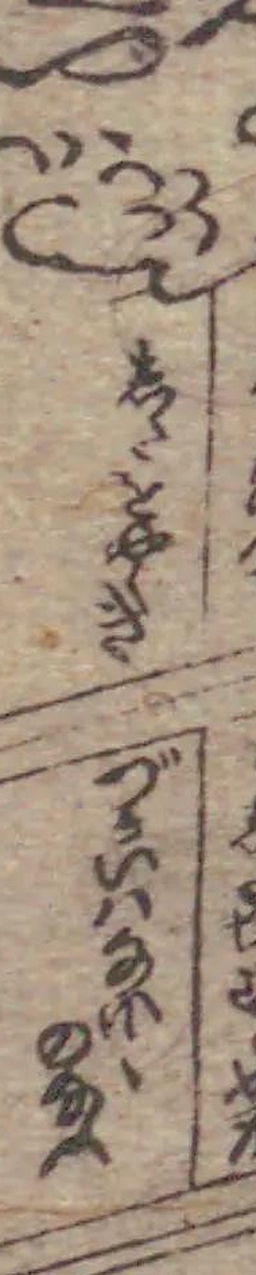したをやくきづかいはないと
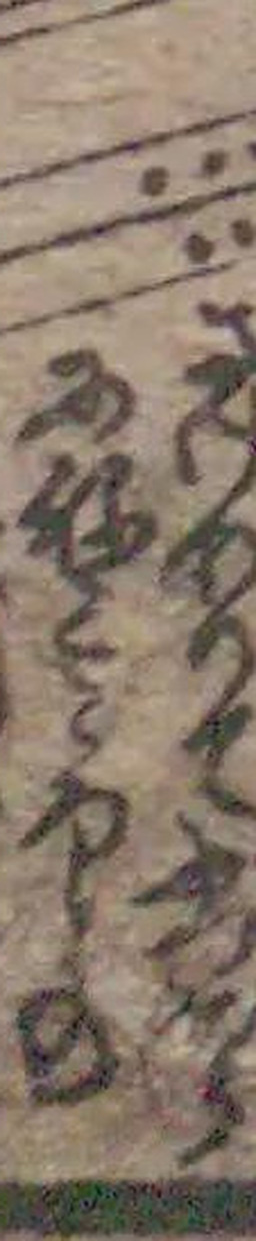にねこころしの
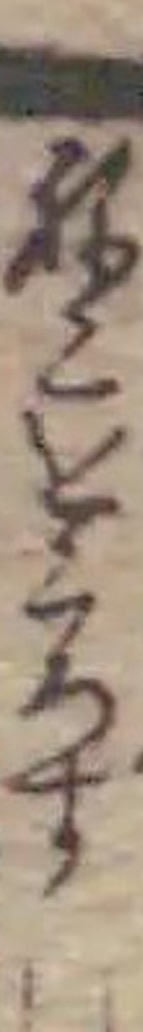ねこをころす
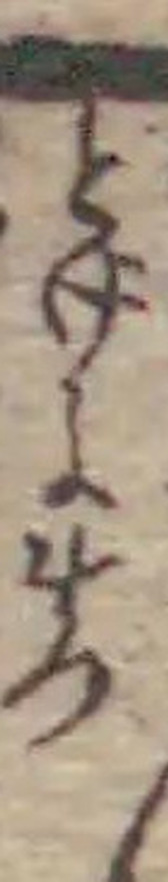とげよまづ
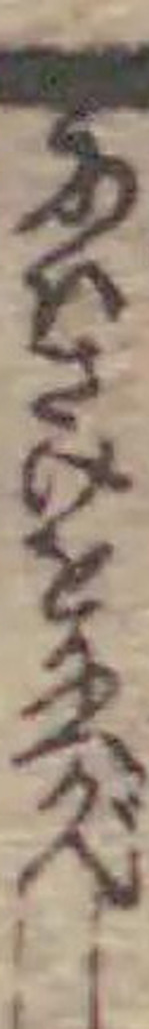にはさけをにへがへ
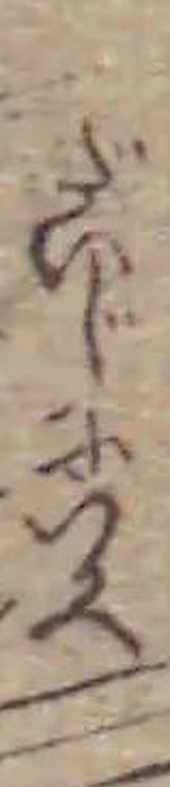だいじにつかへ
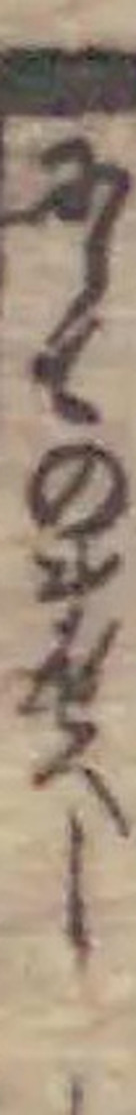にしてのますへし

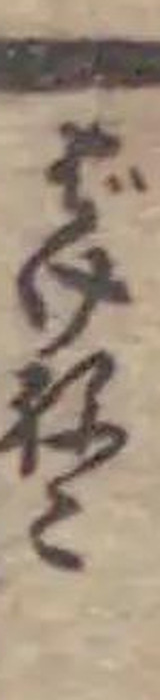ばけねこ
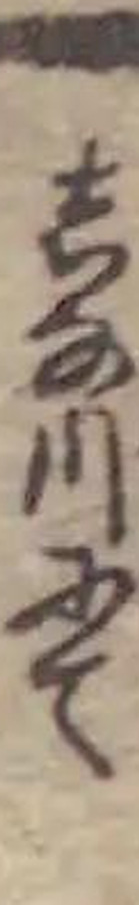しな川にて
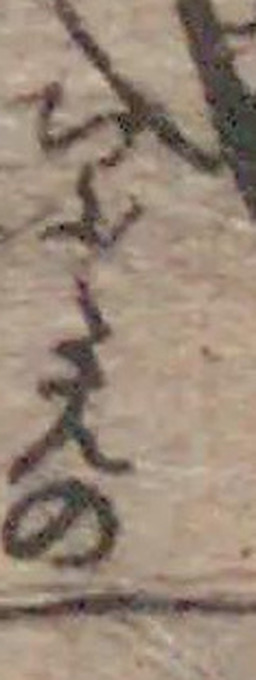ちよ〳〵さんの
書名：冷水灰毛猫 2巻
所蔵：国立国会図書館 National Diet Library, JAPAN
